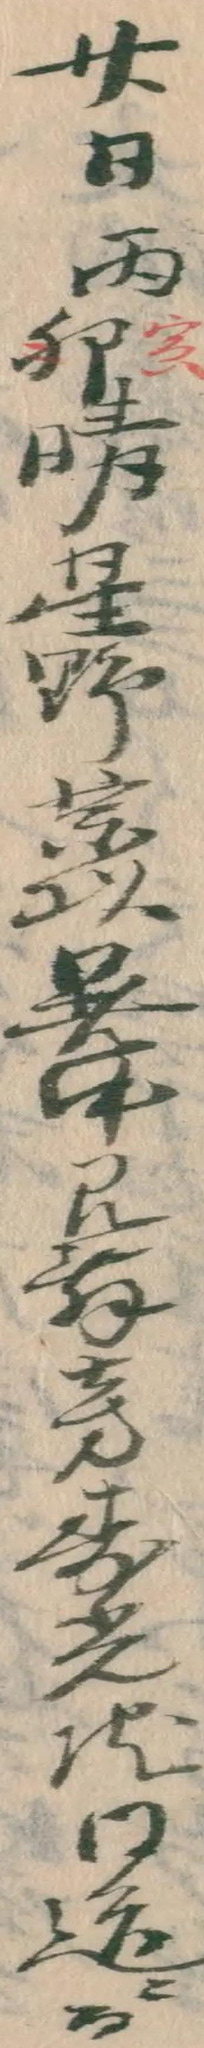廿日丙卯晴星野宗以暑中見舞旁寿光院同道ニ而
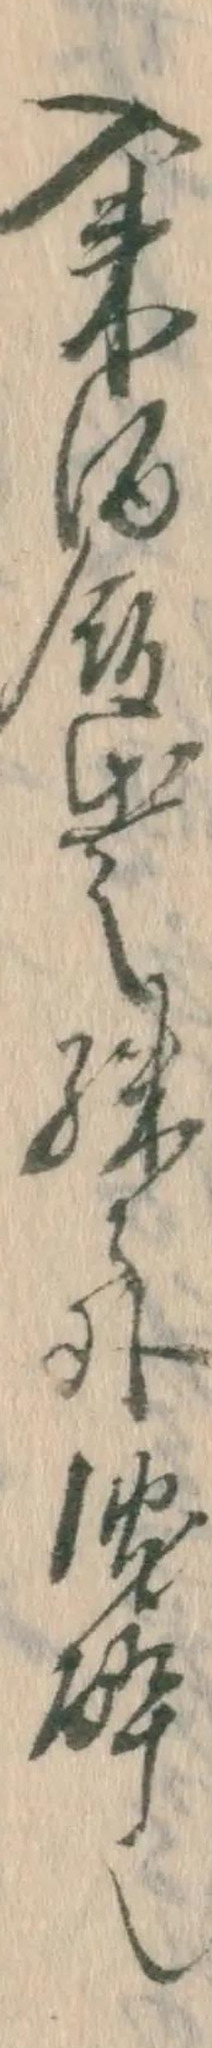入来酒飯出之殊之外沈酔之
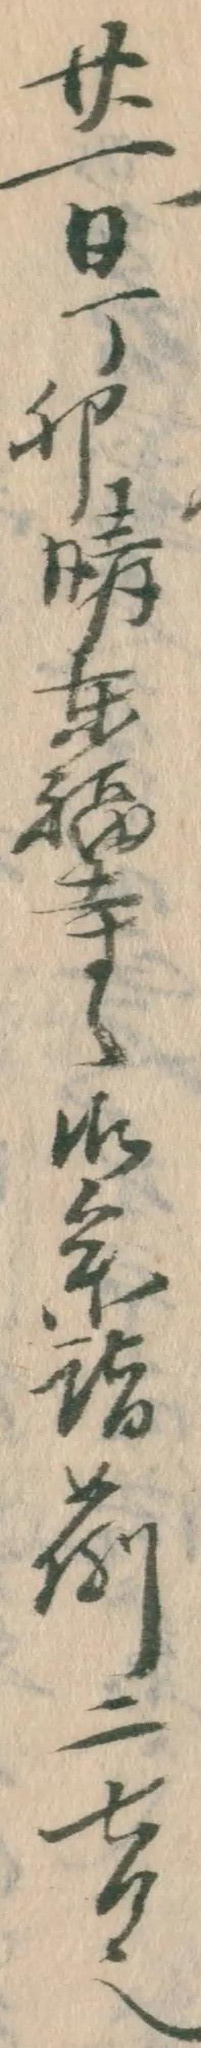廿一日丁卯晴東福寺へ御参詣如例二七日也
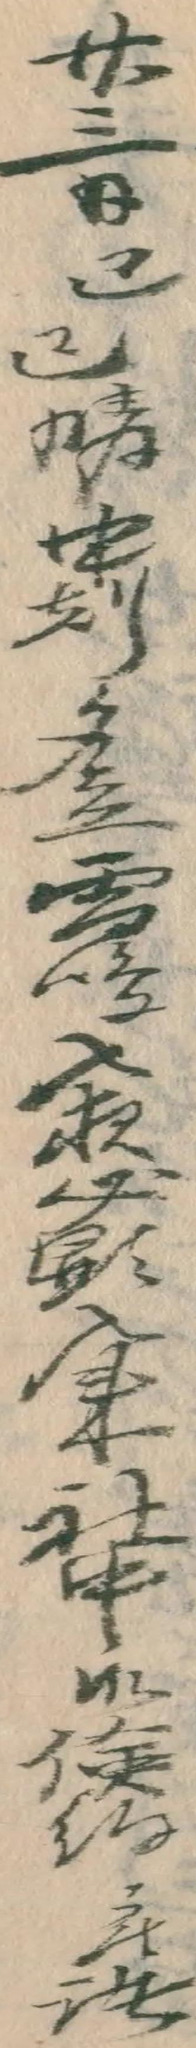廿三日己巳晴申刻夕立雷鳴入夜必顕入来社中御倹約ニ付諸
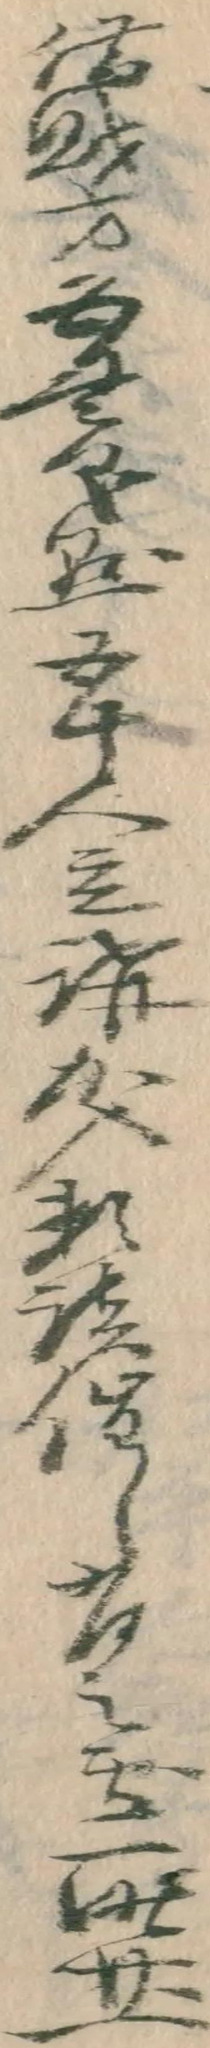借財方五貫匁宛五十人立講加入頼請催し有之處一昨廿一日
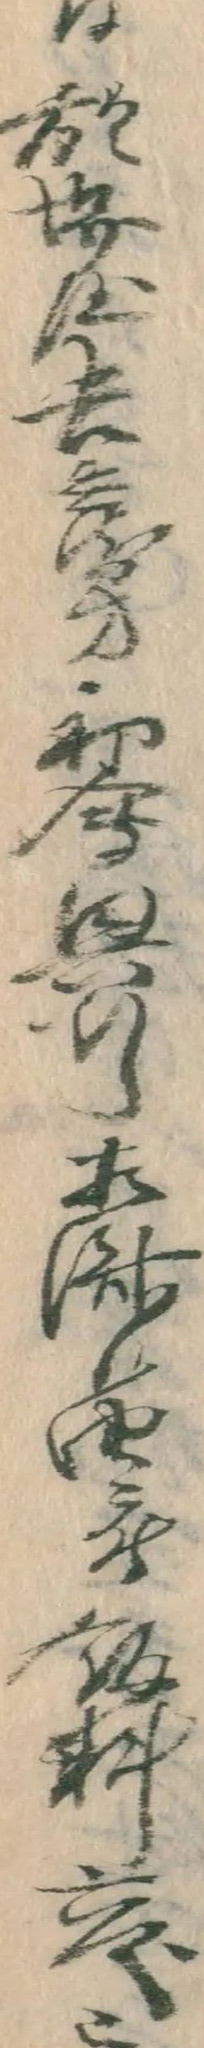日於堺屋吉兵衛方初會興行相済候由ニ付飯料六人被

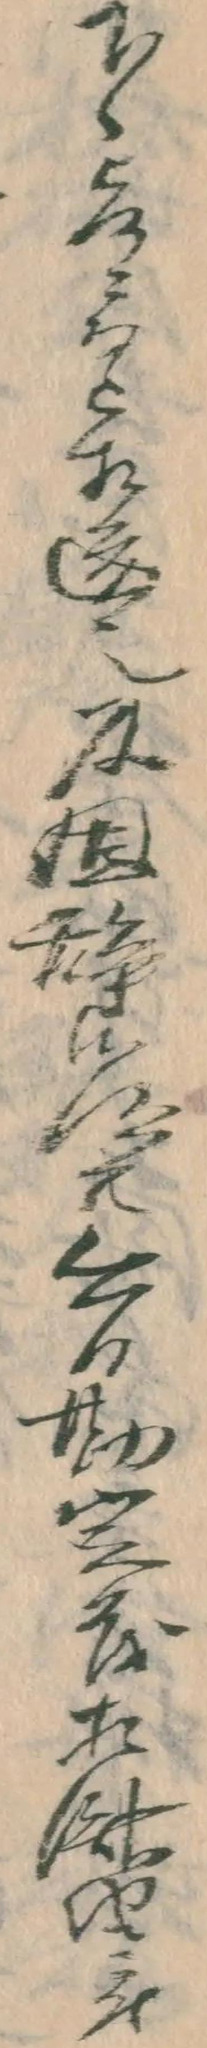下候旨ニ而被相送也及固辞候得共今日勘定も相済由ニ付
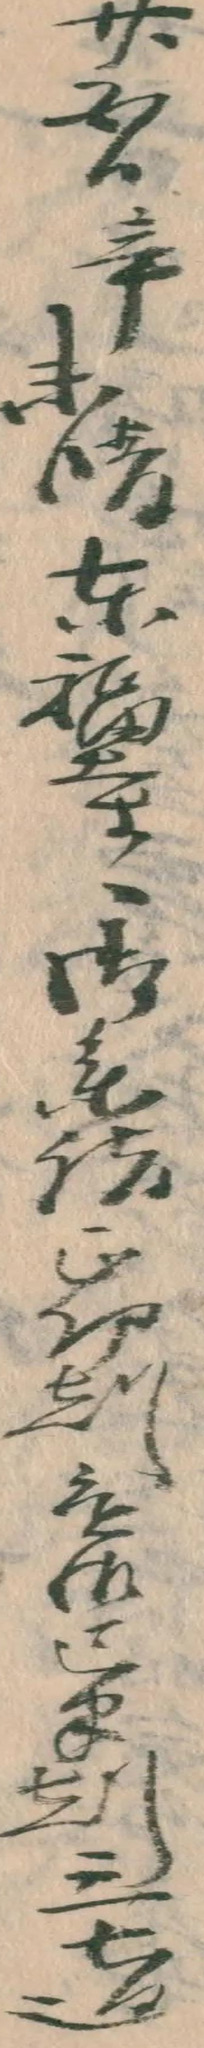廿五日辛未晴東福寺へ御参詣正卯刻御巳半刻三七日也
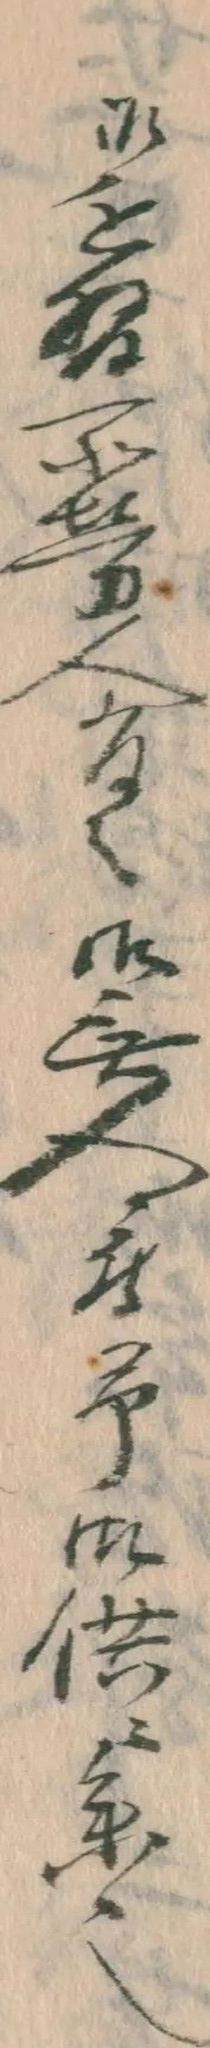御近習所労人有之御無人ニ付予御供ニ参也
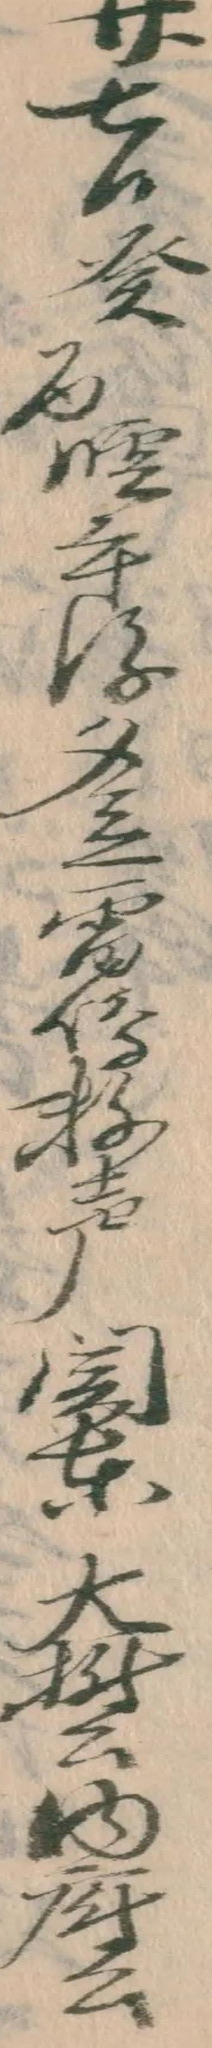廿七日癸酉曇午後夕立雷鳴数声関東大樹公内府公
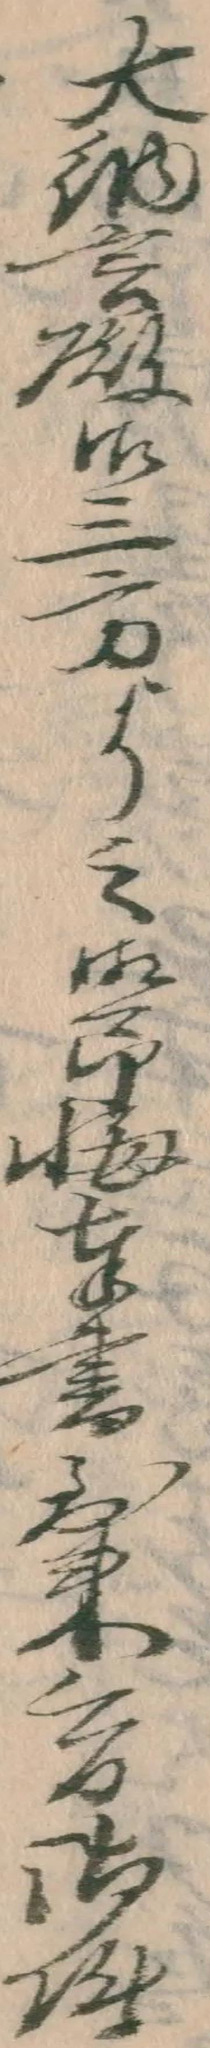大納言殿御三方より之御弔悔奉書到来今日御附
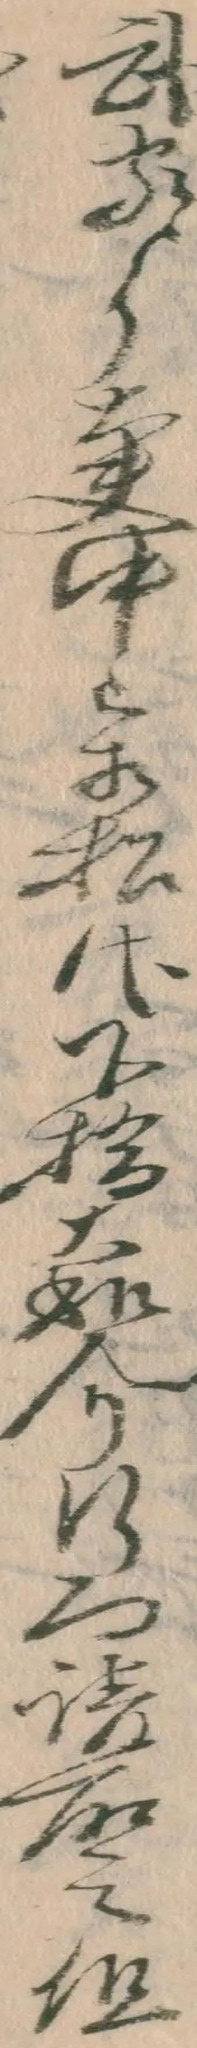武家より大夫中被相招代下橋大和介行向請取之但
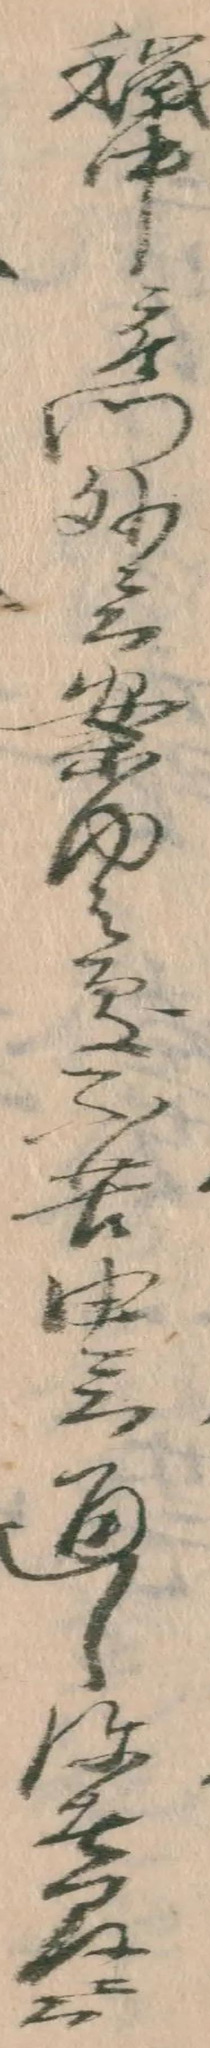穢中ニ付門外ニ而案内之處不苦由ニ而通し弥無間ニ而
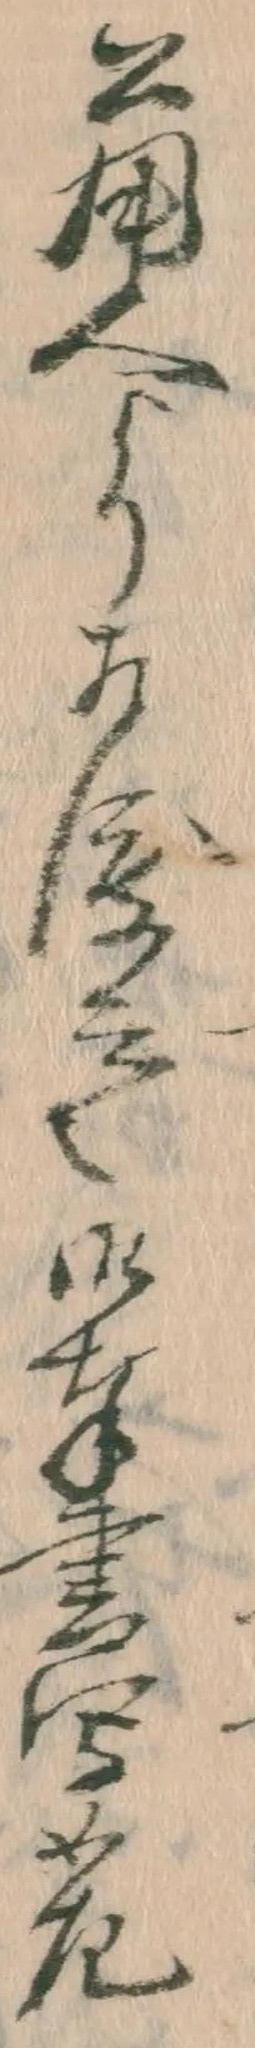公用人より相渡云々御奉書写如左
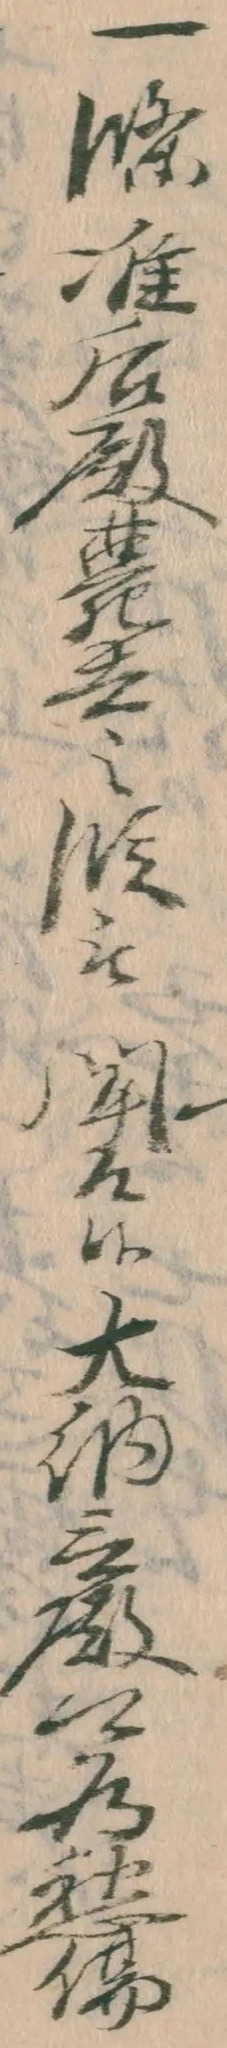一條准后殿薨去之段被聞召候大納言殿以為愁傷
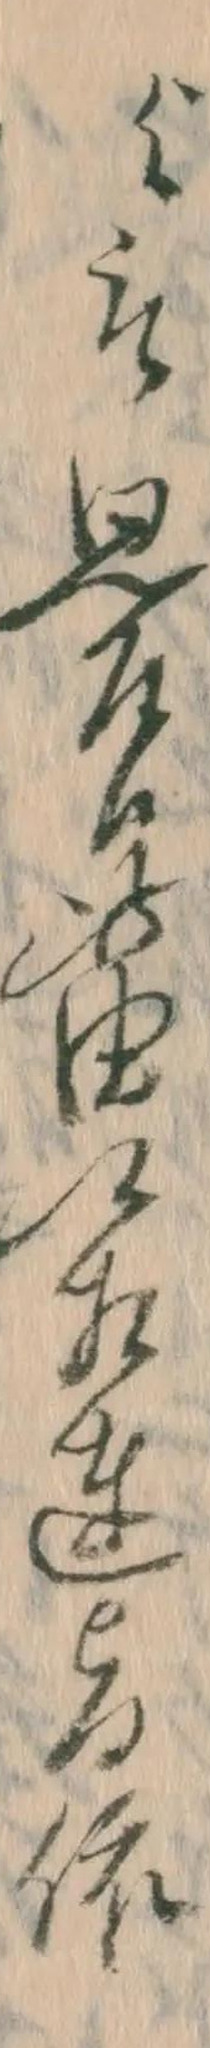と被思召候此由可相達旨依
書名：賀茂社記録. 第67冊
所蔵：国立国会図書館 National Diet Library, JAPAN
